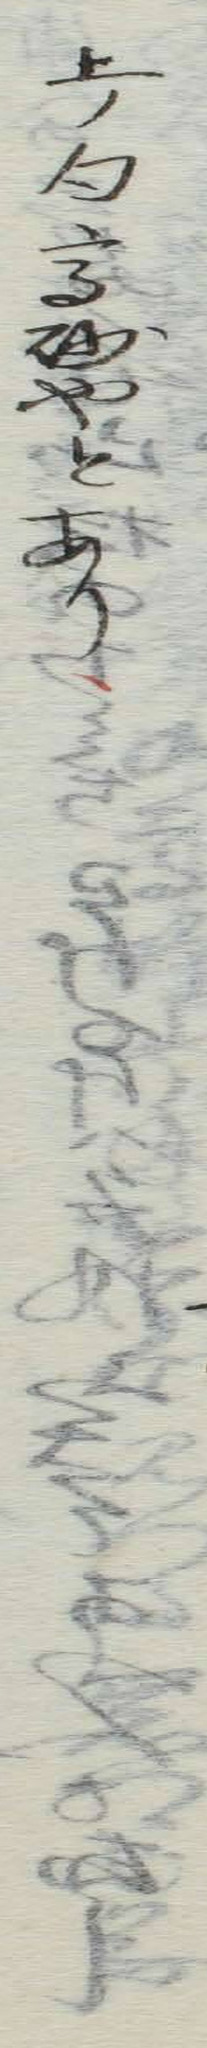上ノ句高砂やとあり、
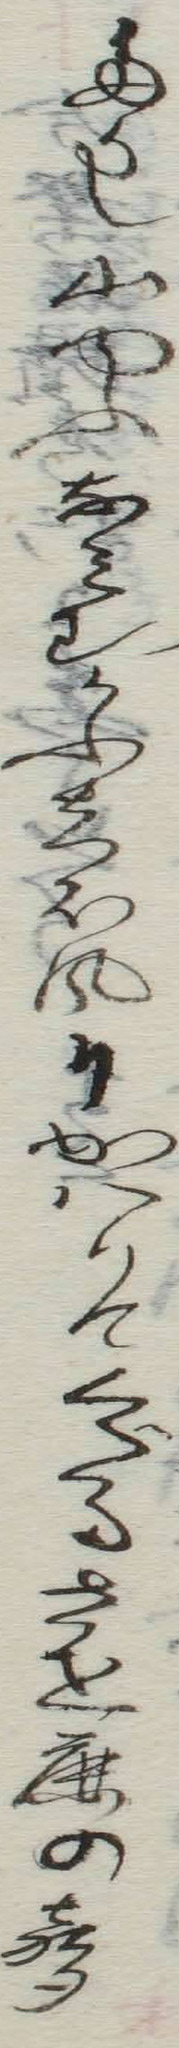たかし山ゆふなみむかふしほ風にかはりてくだるさを鹿の声
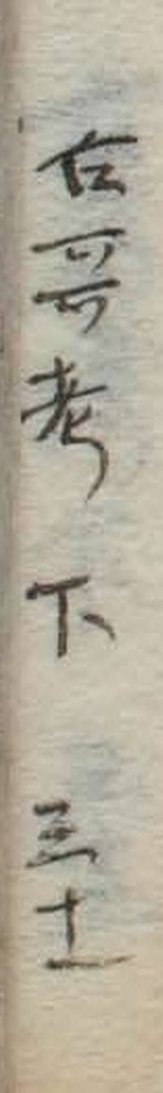古歌考下三十一

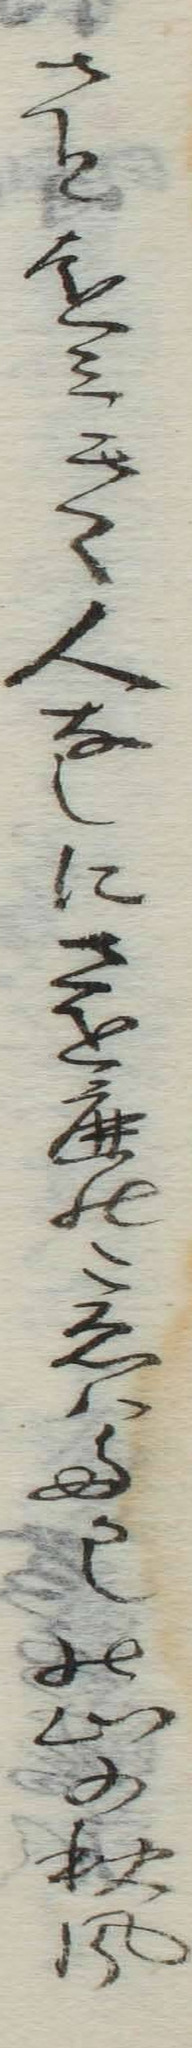さと遠みきく人なしにさを鹿のこゑはたかしの山の秋風
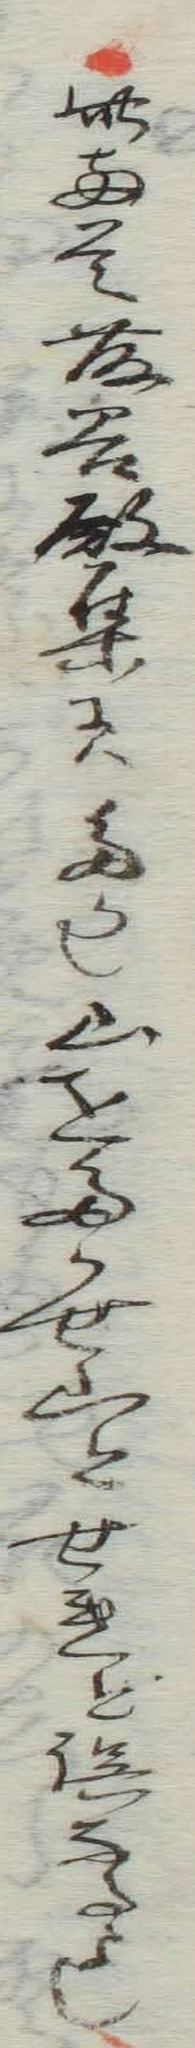●此両首藤谷殿集にはたかし山をたかせ山とせれど誤なるよし、
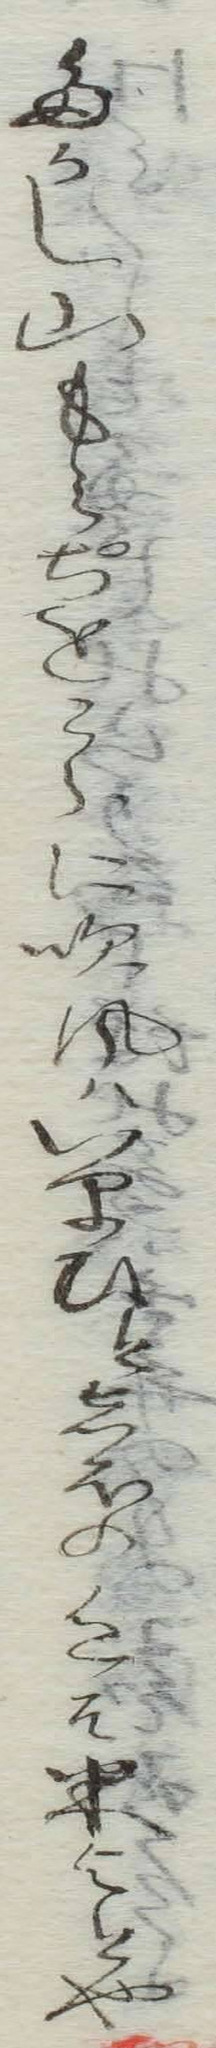たかし山もみちをうらに吹風はいまひとしほの色そめよとや松
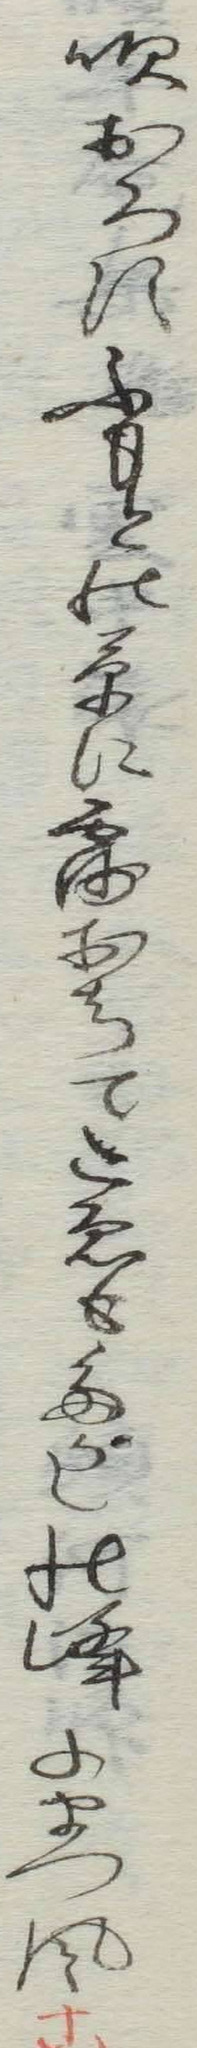吹おろすふもとの草に露おちてこゑもたかしの峰のまつ風ホ
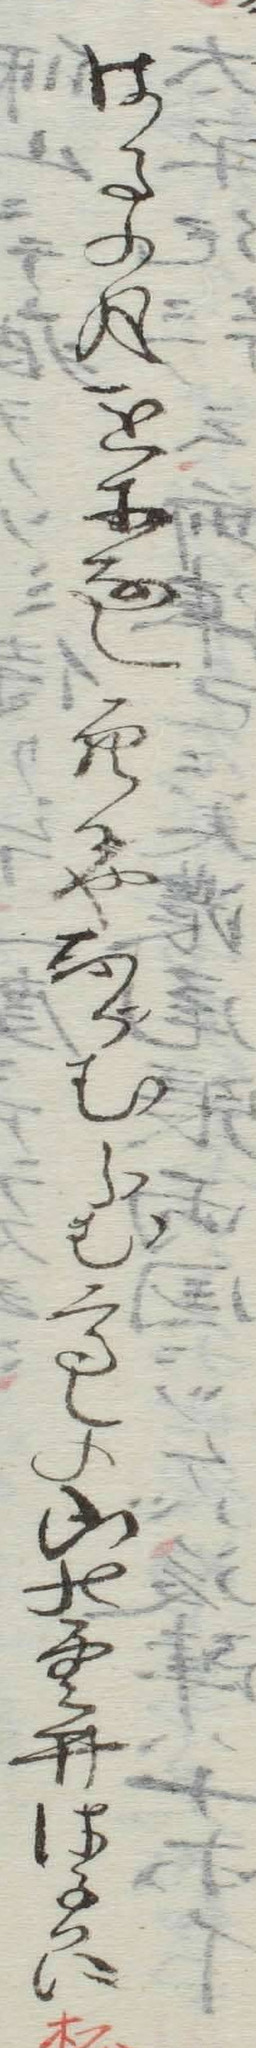はるの月をおなし空にやながむらむ高しの山の雲井はるかに松
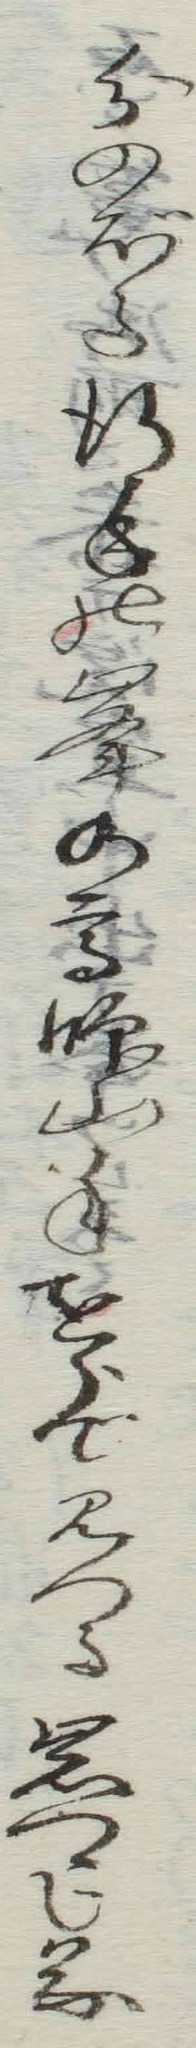分のぼる行手の峯の高師山手をらで見つる岩つゝじかな
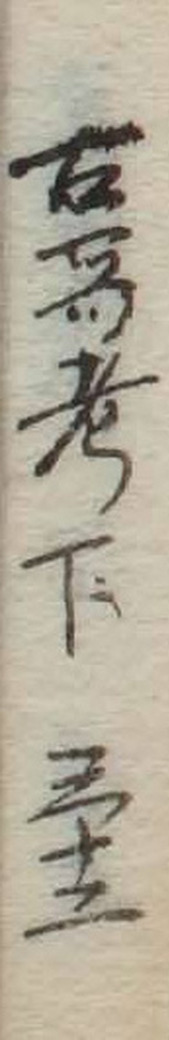古歌考下三十二

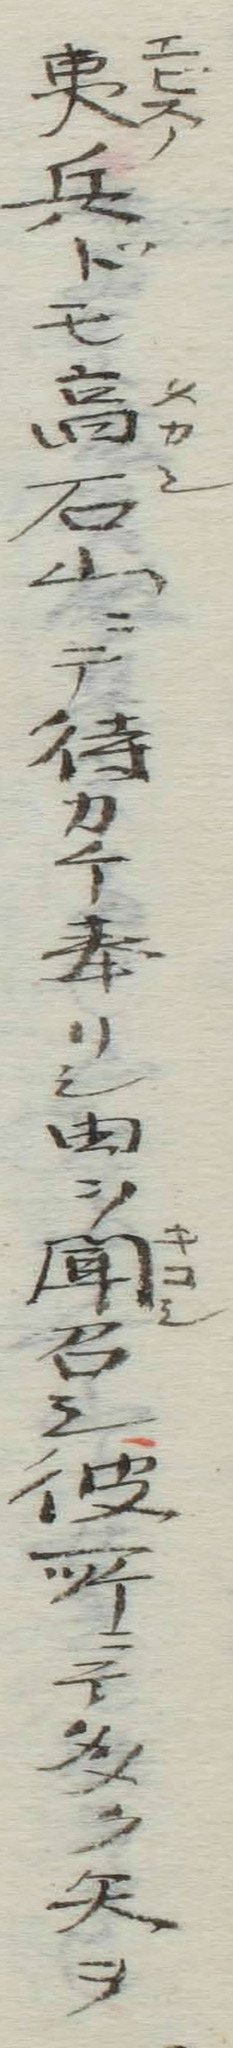夷兵ドモ高石山ニテ待カケ奉リシ由ヲ聞召シ、彼所ニテ多ク矢ヲ
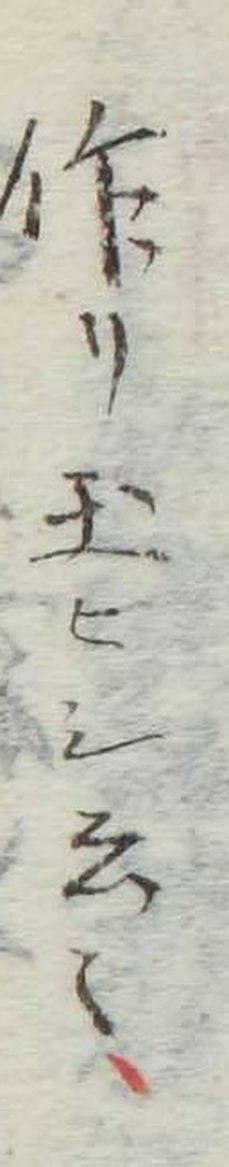作り玉ヒシ云々、
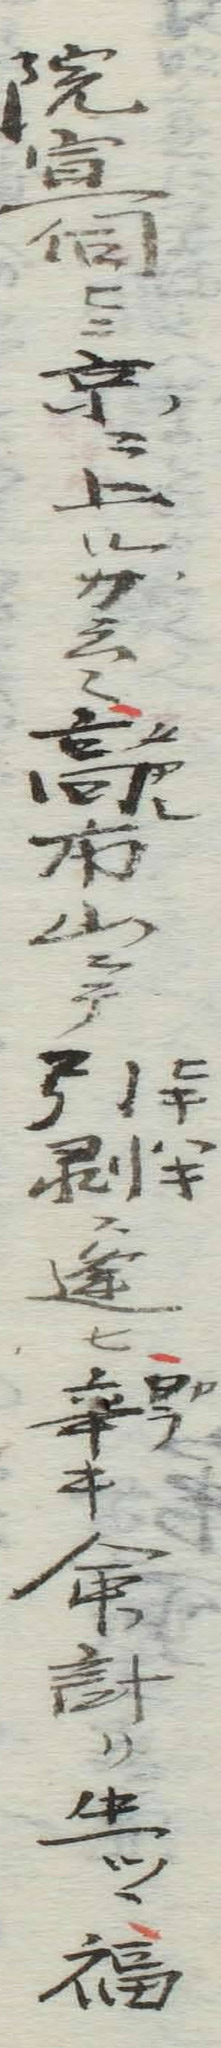院宣伺ヒニ京ニ上ルガ云々、高市山ニテ引剥ニ逢ヒ、辛キ命計リ生ツヽ、福
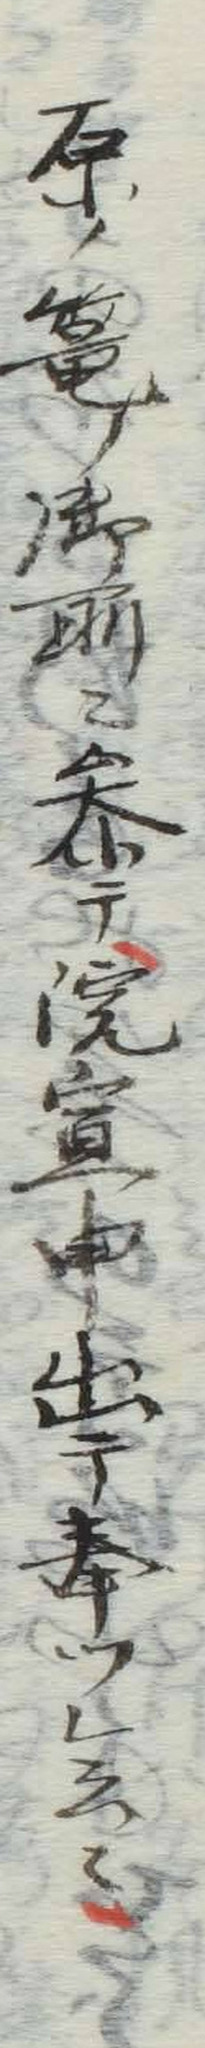原ノ篭ノ御所ニ参テ、院宣申出テ奉ツレ云々、
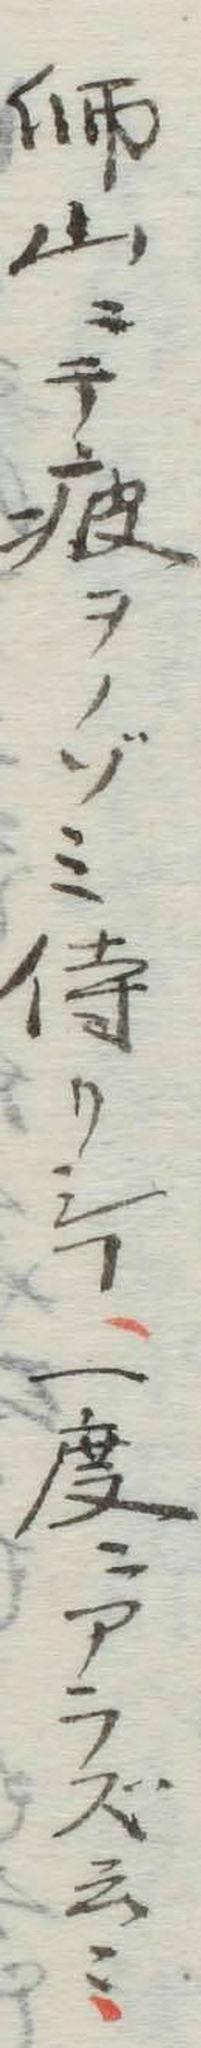師山ニテ疲ヲノゾミ侍リシコト、一度ニアラズ云々、
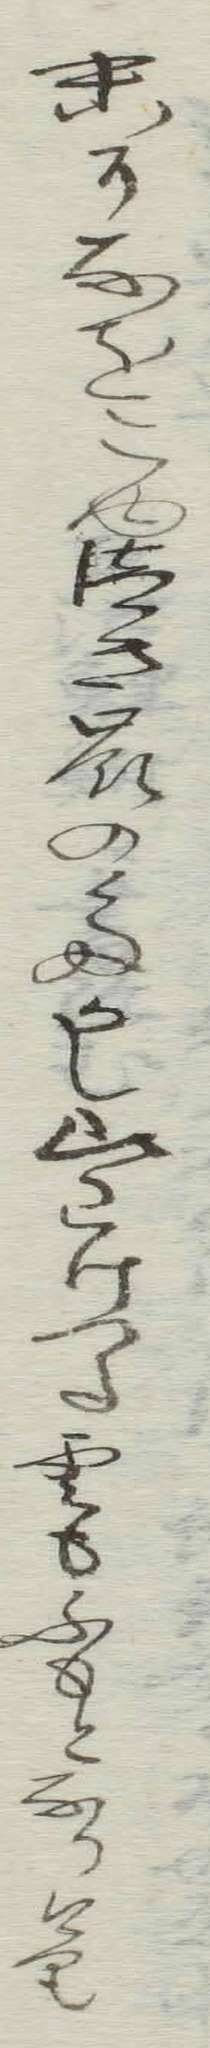末になをこゆへき嶺のたかし山わけつる雲もふもとなりけり
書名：三河国古跡考
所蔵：国文学研究資料館
